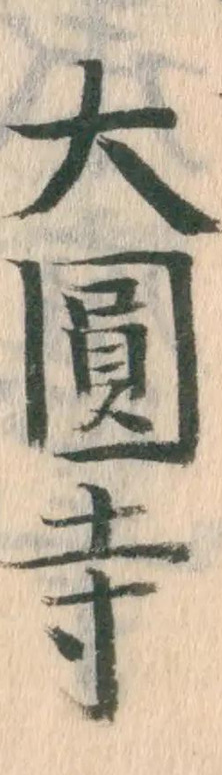大円寺
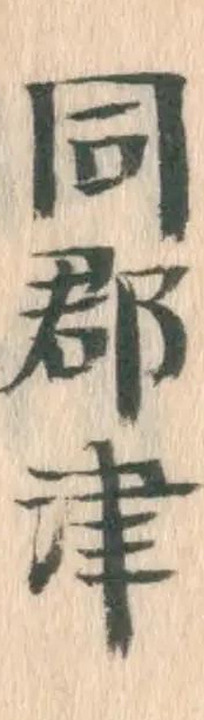同郡津

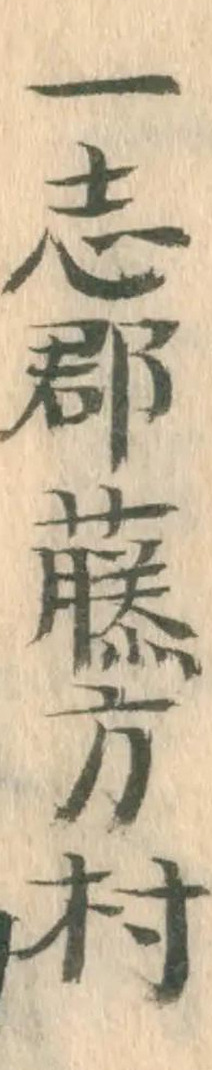一志郡藤方村
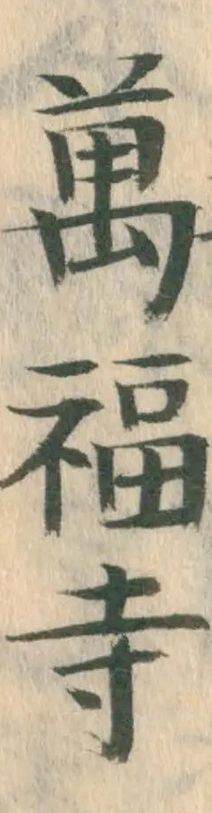萬福寺
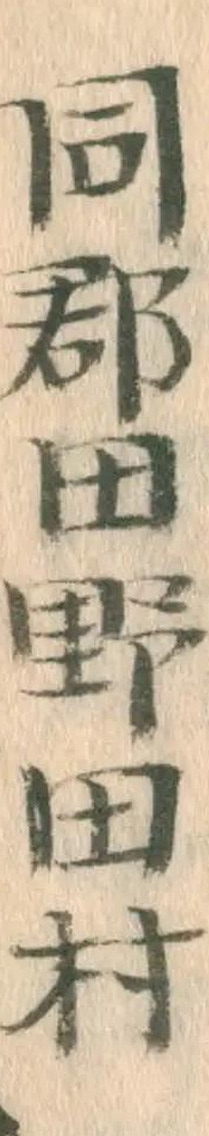同郡田野田村
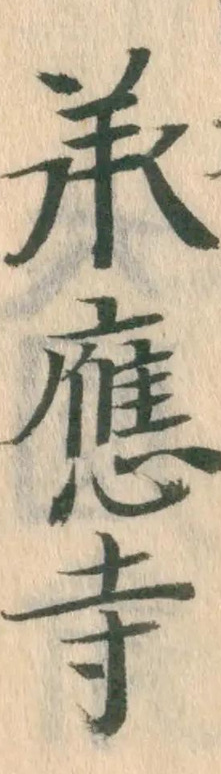承応寺
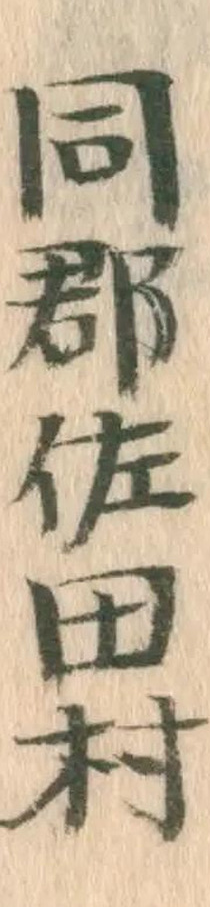同郡佐田村
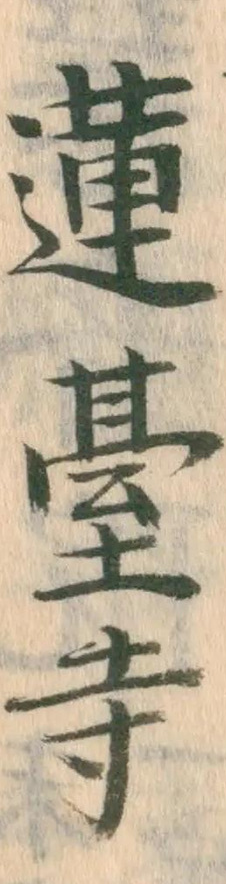蓮台寺
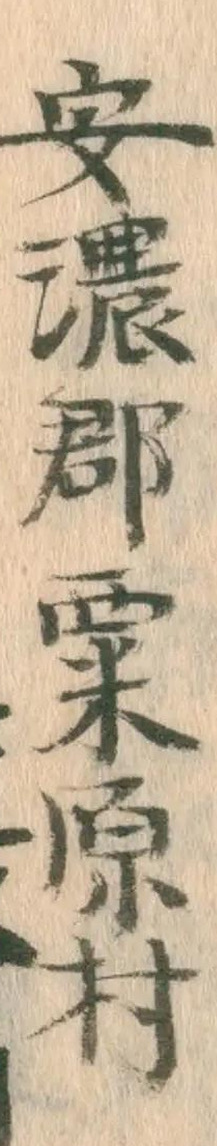安濃郡栗原村
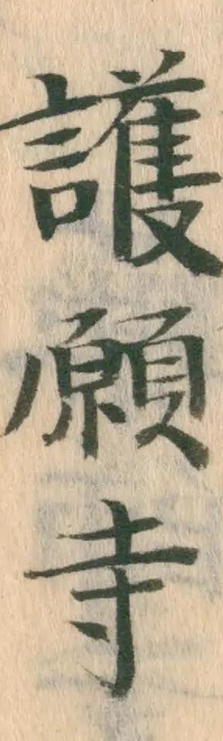護願寺
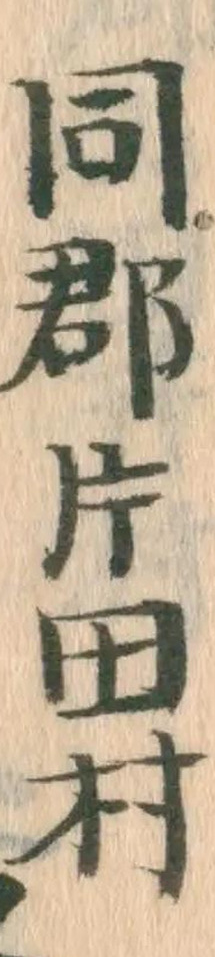同郡片田村
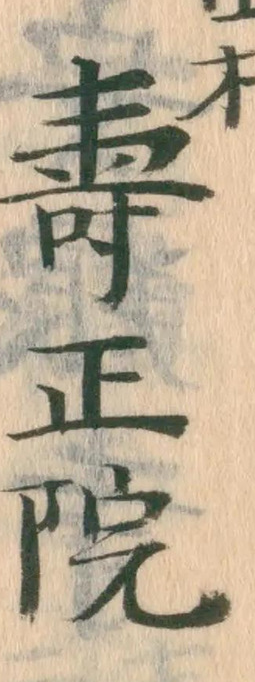寿正院
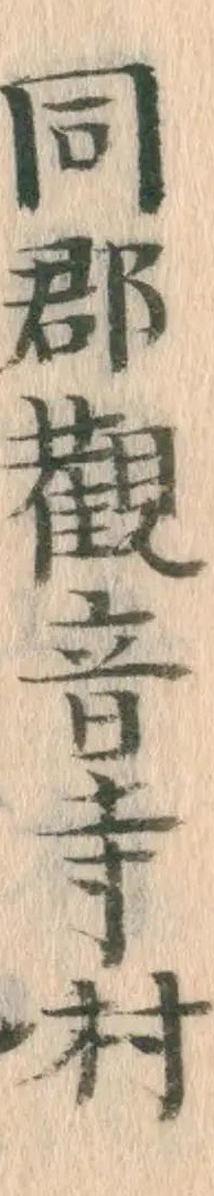同郡観音寺村
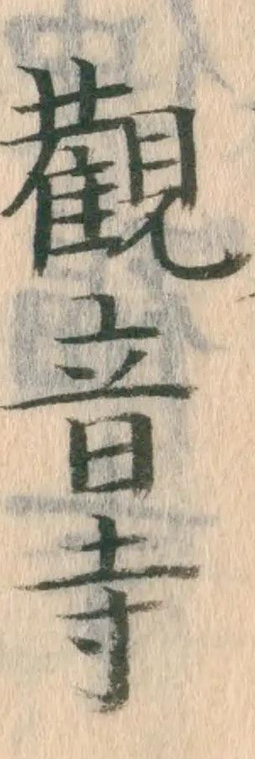観音寺
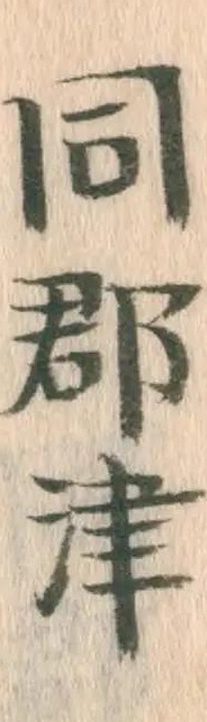同郡津
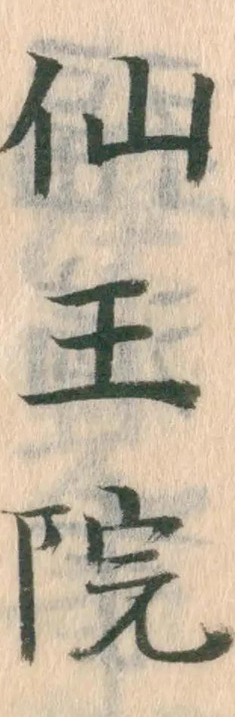仙王院
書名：古義真言宗本末帳 21巻. [4] 第三 伊賀国、伊勢国、志摩国、尾張国、三河国、遠江国、駿河国、伊豆国、甲斐国
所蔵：国立国会図書館 National Diet Library, JAPAN
